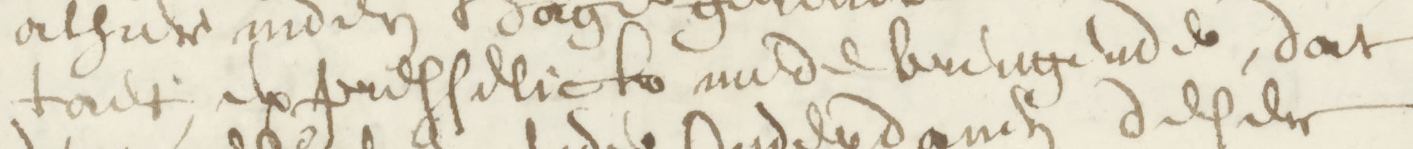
taet, expresselick mede brengende, dat
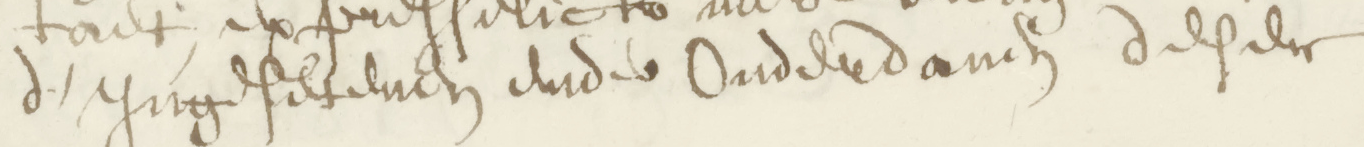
d‛Ingesetenen ende Onderdanen deser
